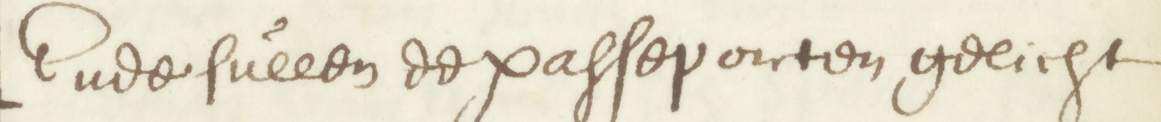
Ende sullen de passeporten gelicht
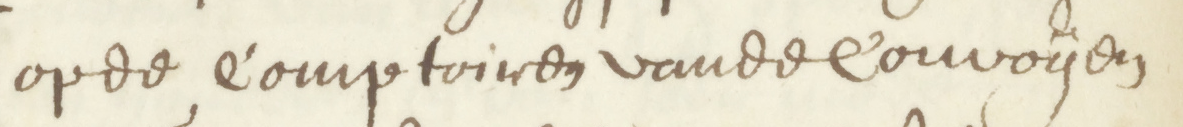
opde Comptoiren vande Convoijen
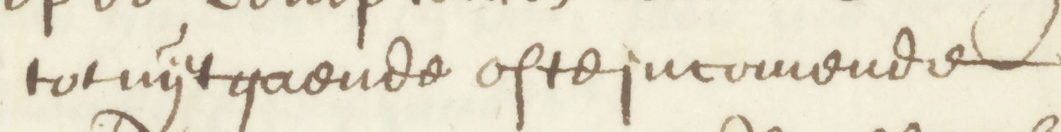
tot uijtgaende ofte incomende
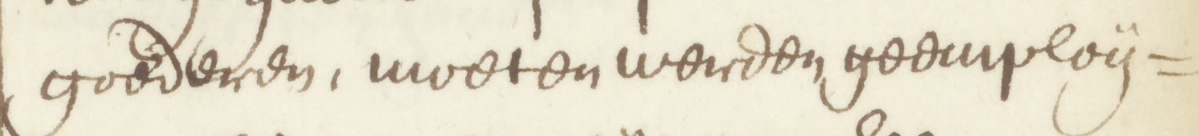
goederen, moeten werden geemploij=
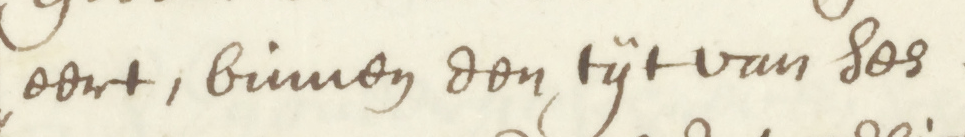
„eert, binnen den tijt van Ses —
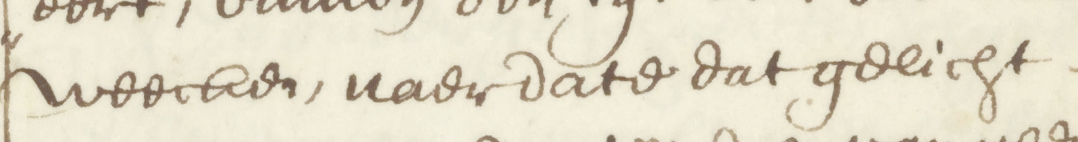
weecken, naer date dat gelicht —
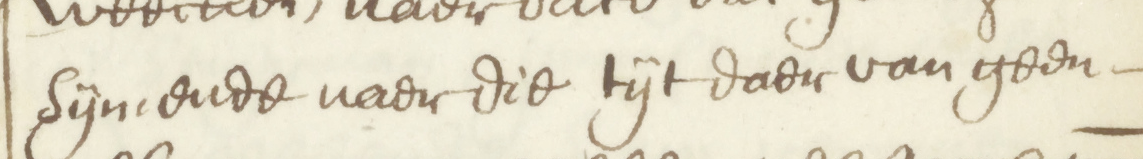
sijn, ende naer die tijt daer van geen —
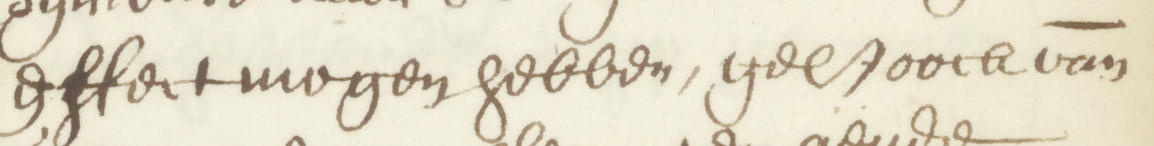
Effect mogen hebben, gel oock van
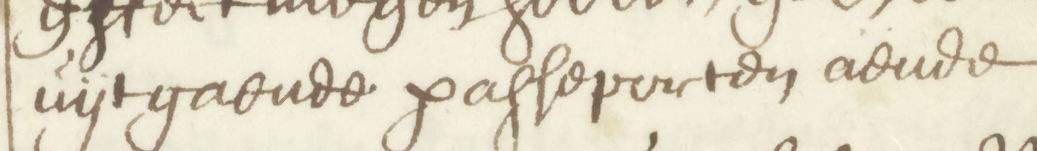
uijtgaende passeporten aende
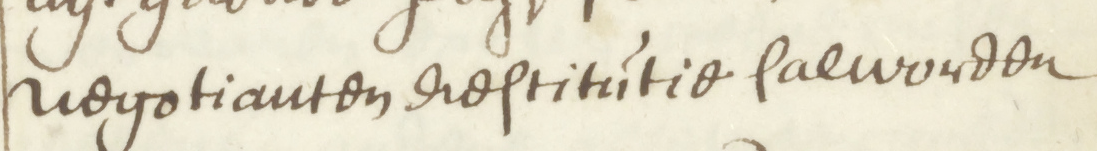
negotianten restitutie sal worden
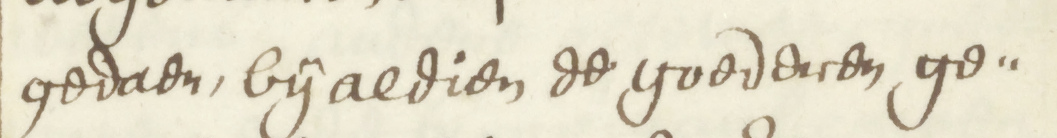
gedaen, bij aldien de goederen ge„
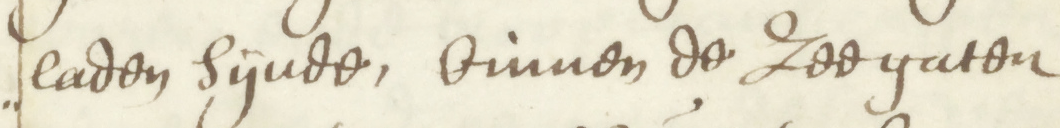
„laden sijnde, binnen de Zeegaten
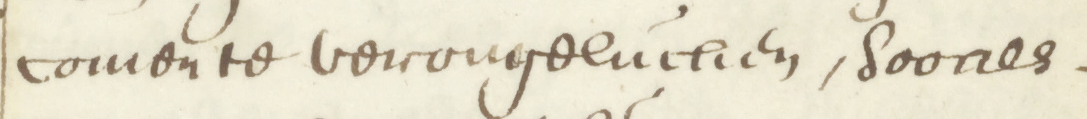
comen te verongelucken, Sooals —
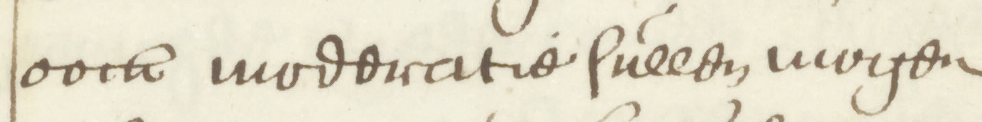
oock moderatie sullen mogen
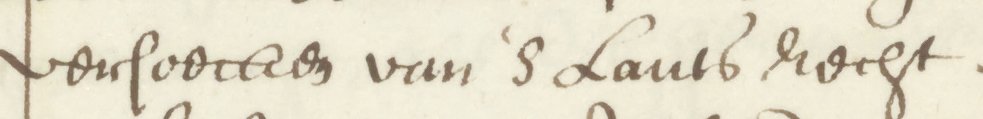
versoecken van ‛s Lants recht —
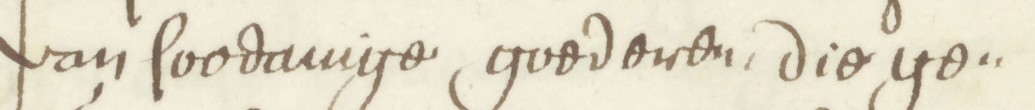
van soodanige goederen, die ge„
